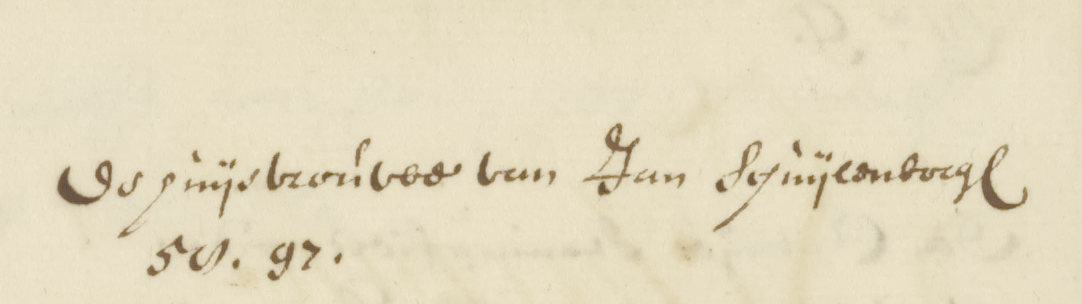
De huijsvrouwe van Jan Schuijlenborgh
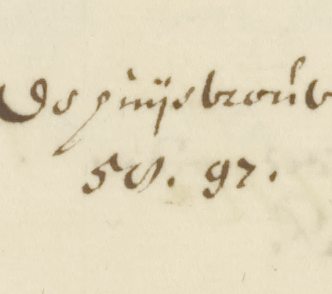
58, 97.
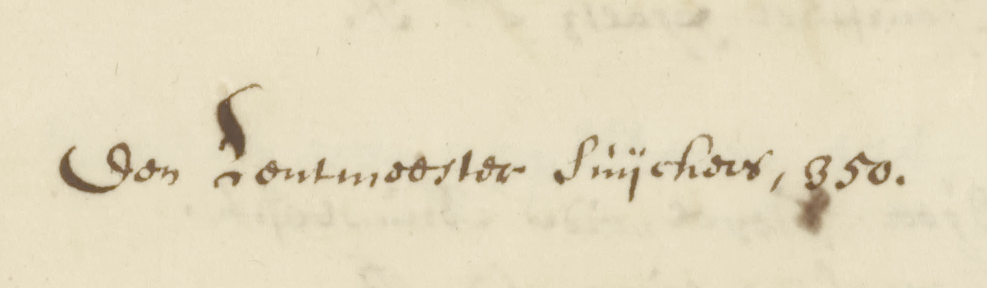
Den rentmeester Suijckers, 350:
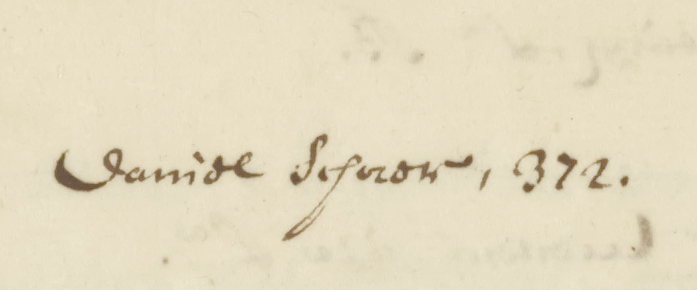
Daniel Schorer, 372.
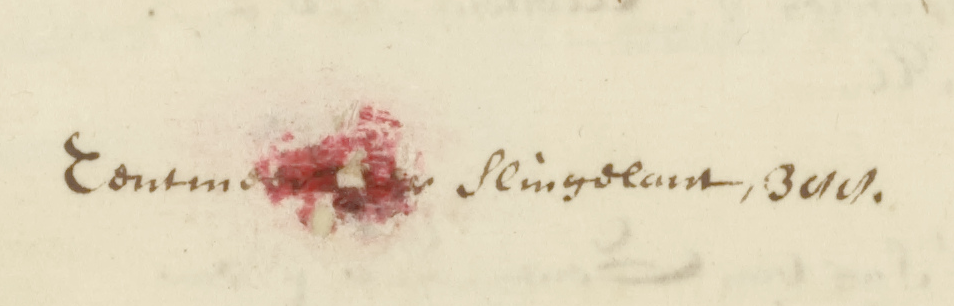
rentmr. Slingelant, 388.
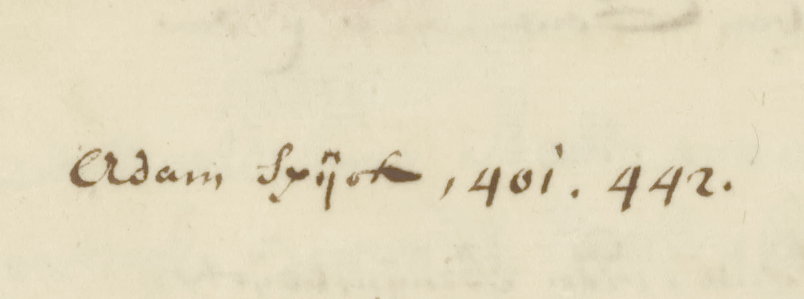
Adam Spijck, 401, 442.
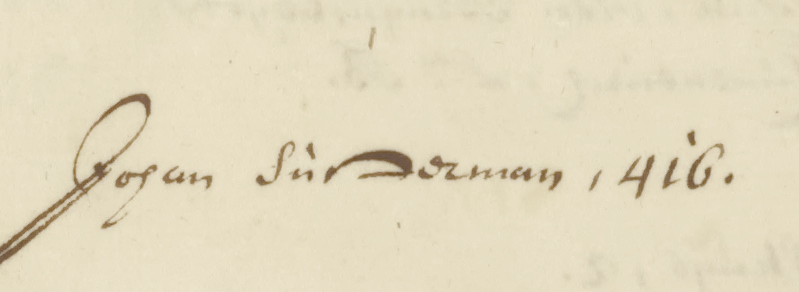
Johan Susterman, 416.
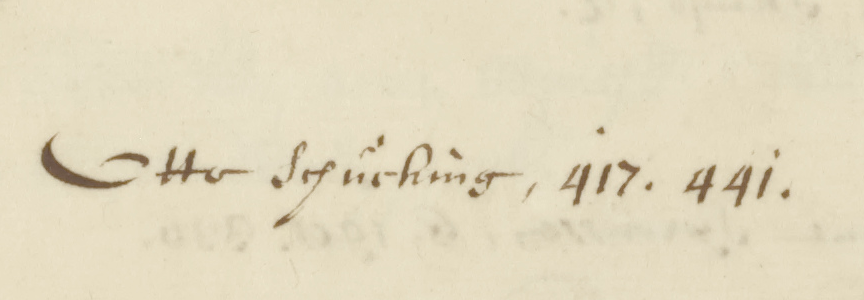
Otte Schucking, 417, 441.
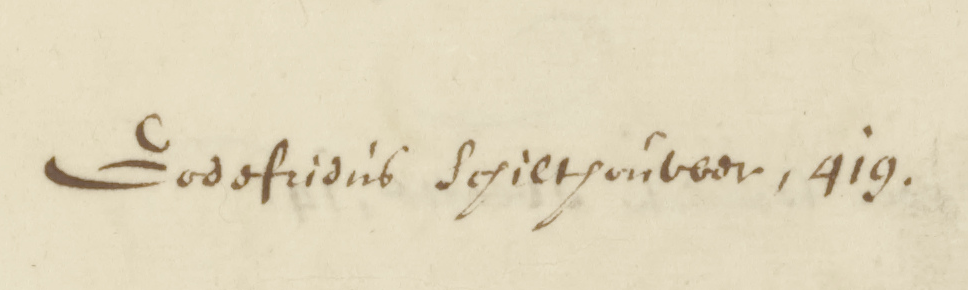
Godefridus Schilthouwer, 419
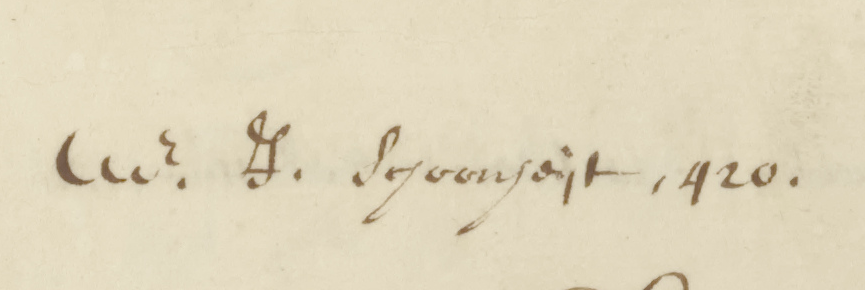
Mr. J. Schoonheijt, 420.
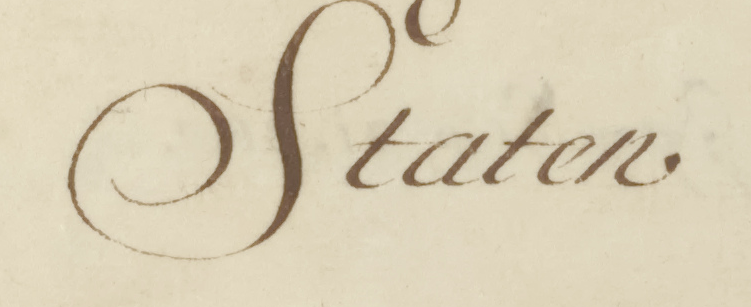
Staten
